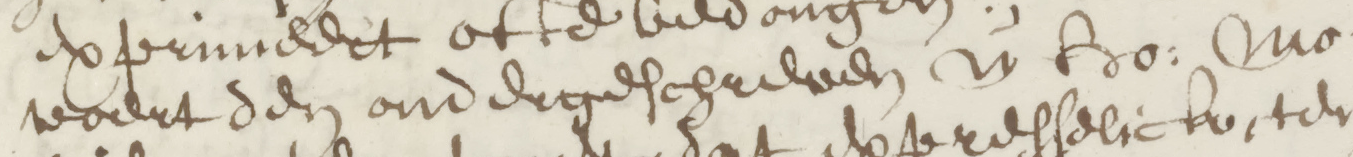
voert den ondergeschreven U Ho:Mo:
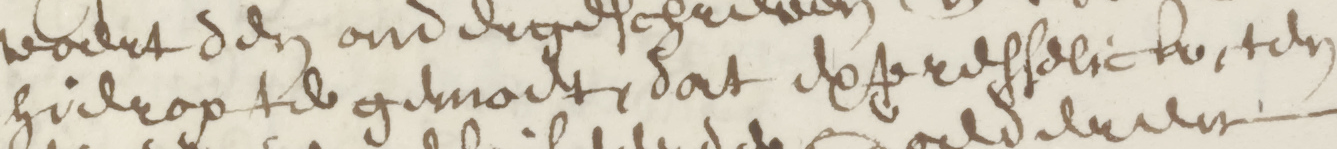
hierop te gemoet, dat expresselick, ten
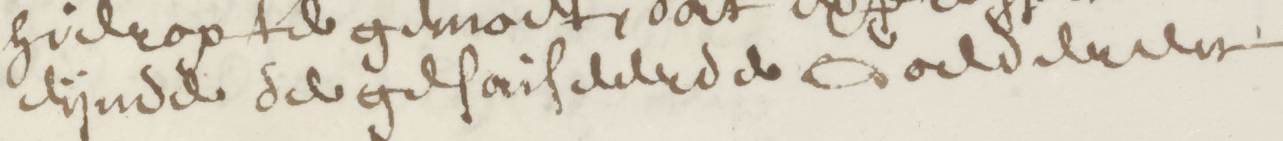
eijnde de gesaiseerde Goederen
